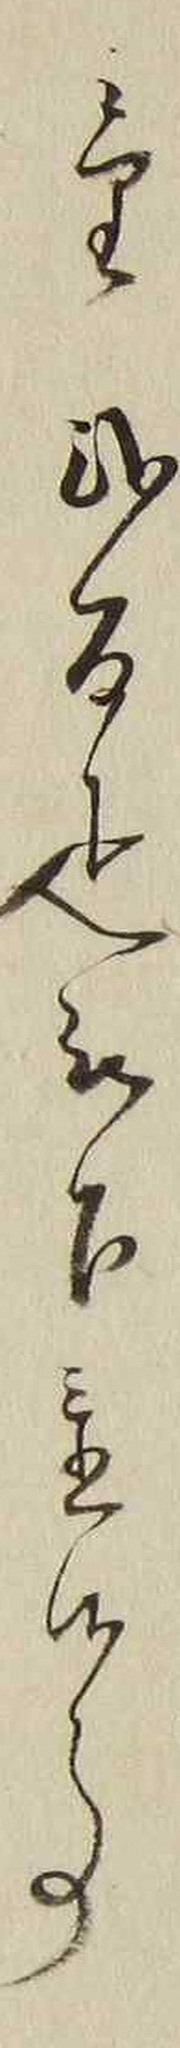金弐百疋被下置候事
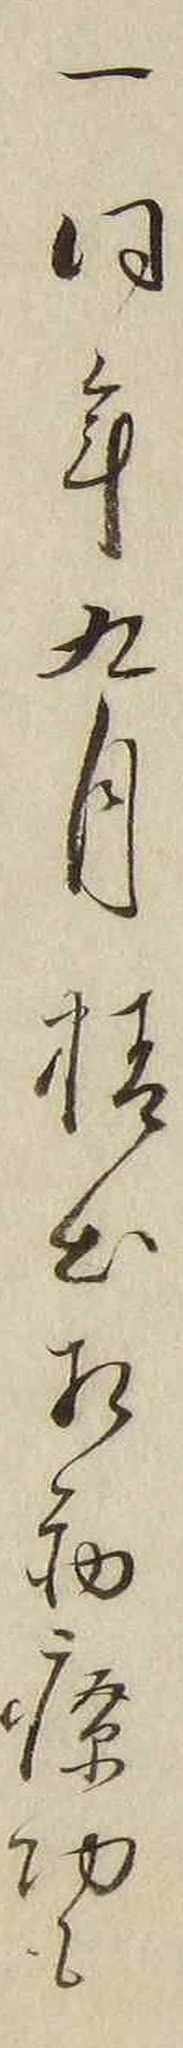一同年九月精出相勤療功も
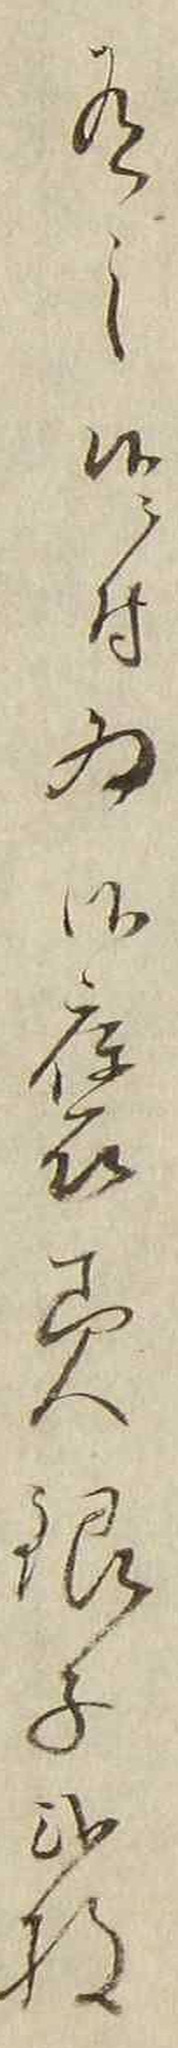有之候ニ付為御褒美銀子弐枚

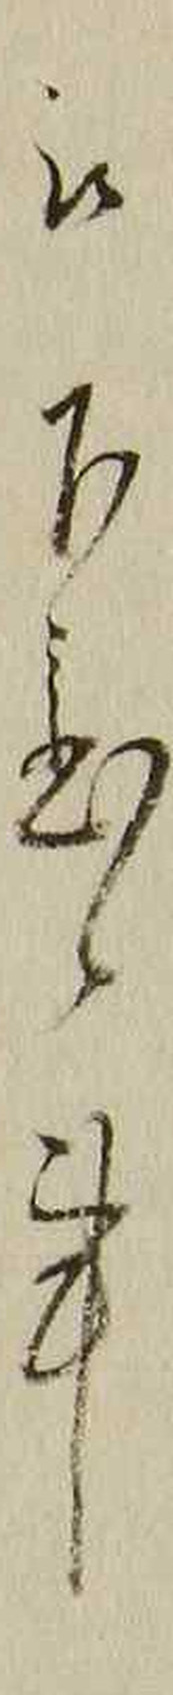被下置候事
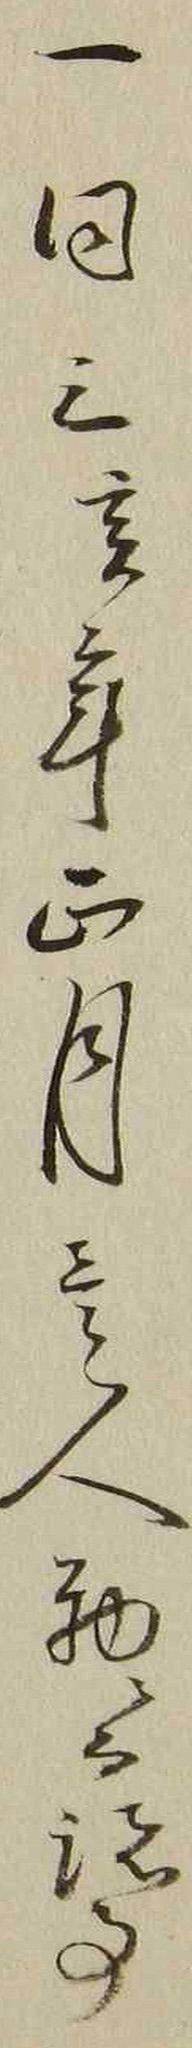一同三亥年正月壱人勤ニ而諸事
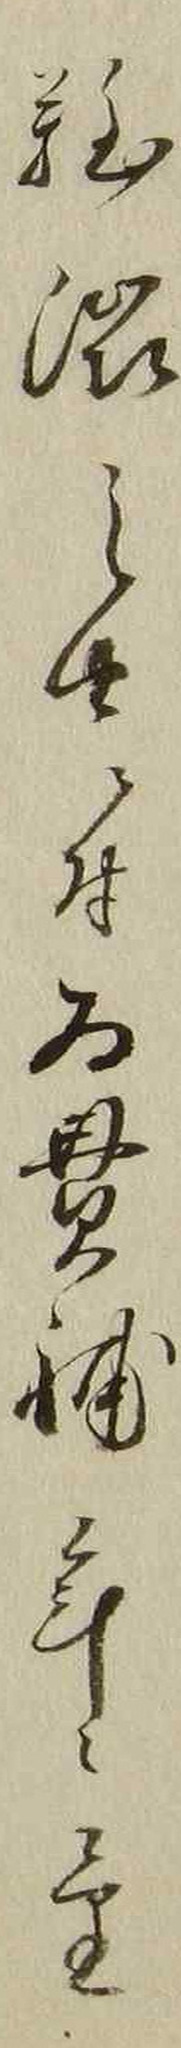難渋之由ニ付為費補年ニ金
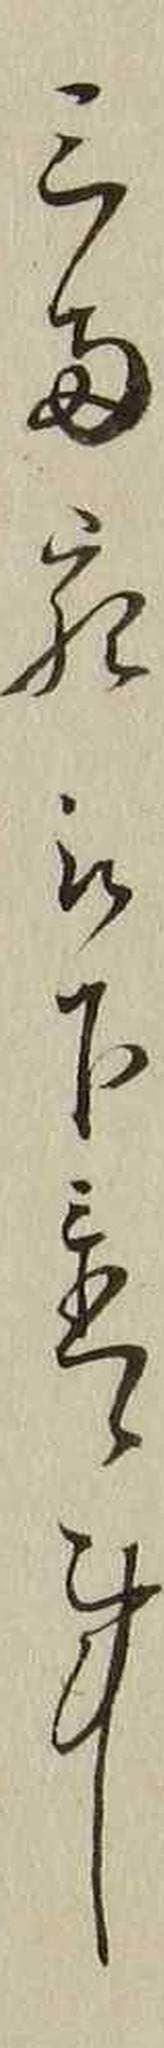三両宛被下置候事
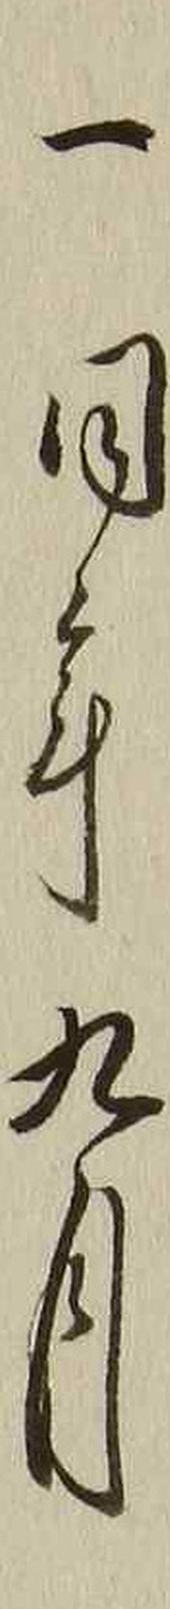一同年九月
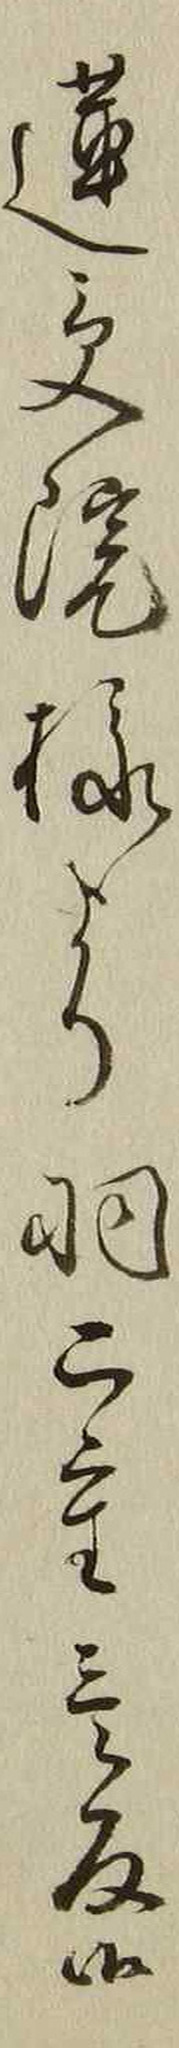蓮受院様より羽二重壱反御
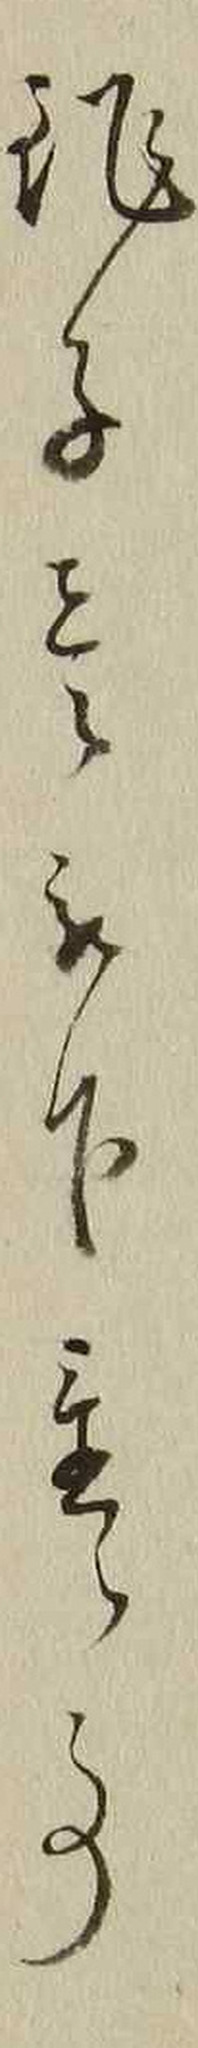銚子壱被下置候事
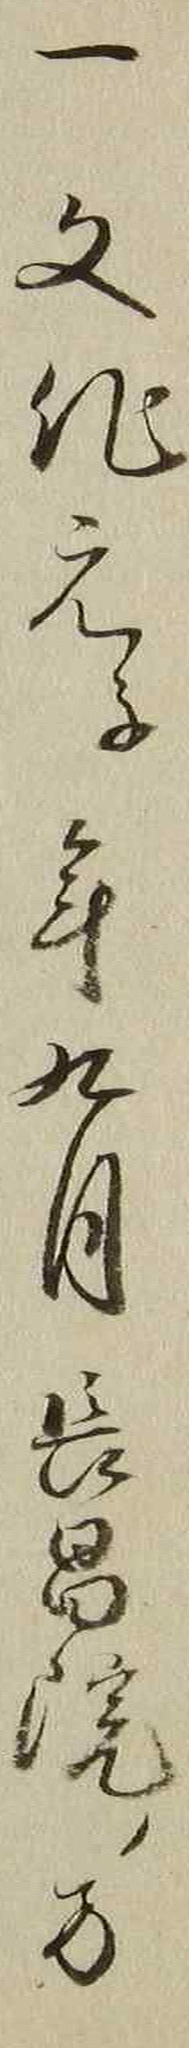一文化元子年九月長昌院ノ方
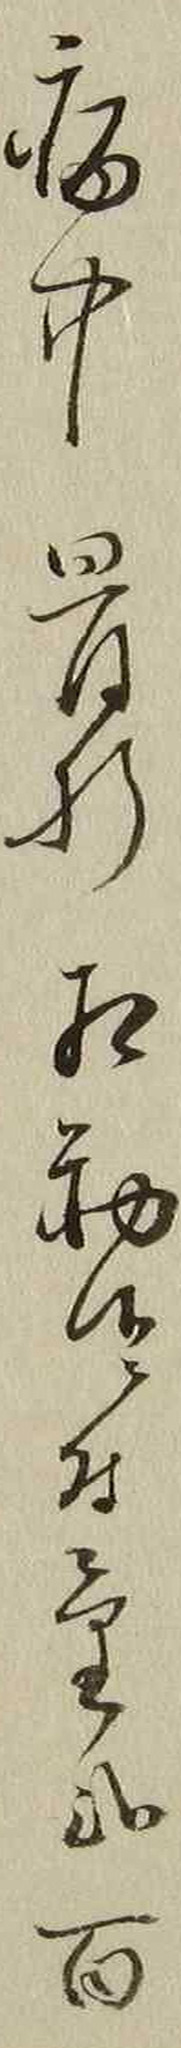病中骨折相勤候ニ付金弐百
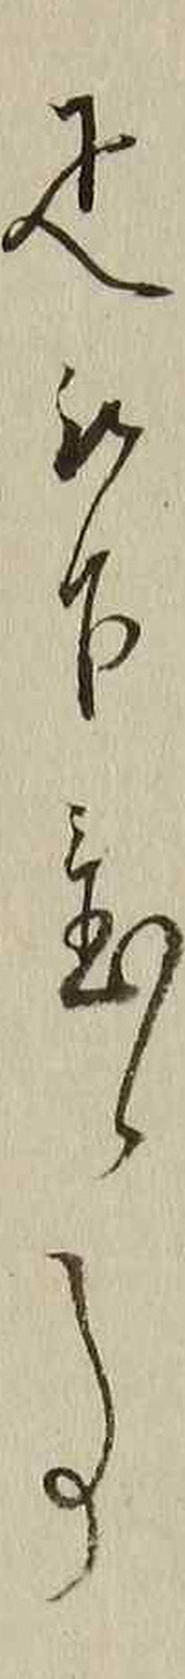疋被下置候事
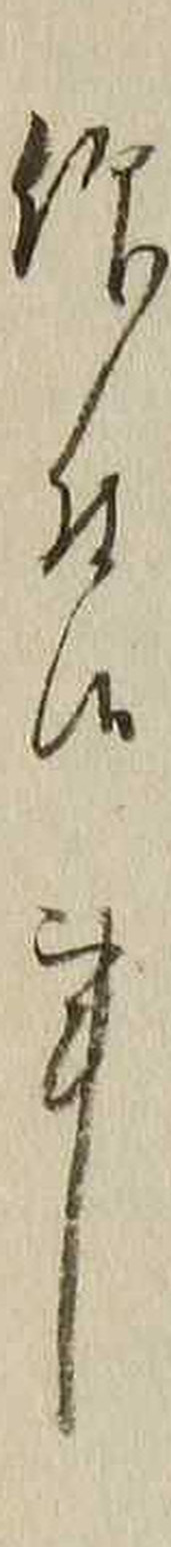仰付候事
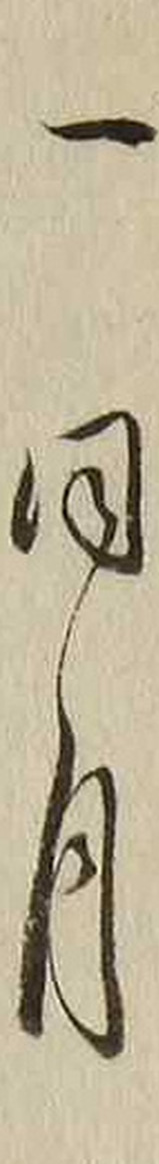一同月
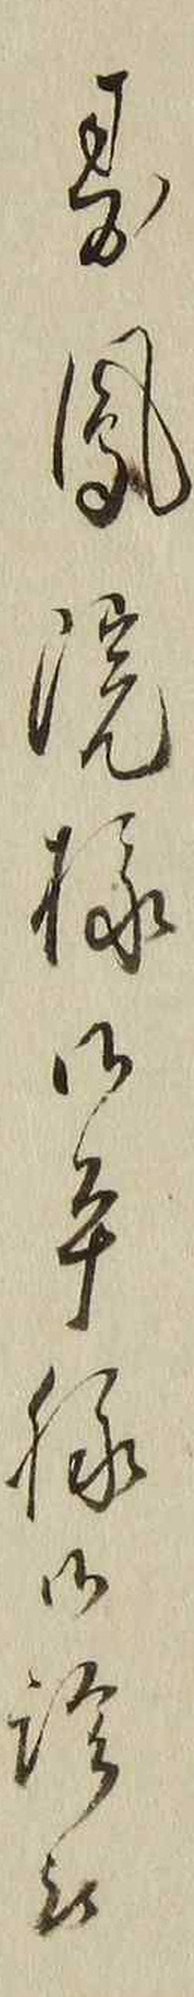寿鳳院様御平脈御診被
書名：諸士系譜　巻之129　た之部5
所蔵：会津若松市立会津図書館
